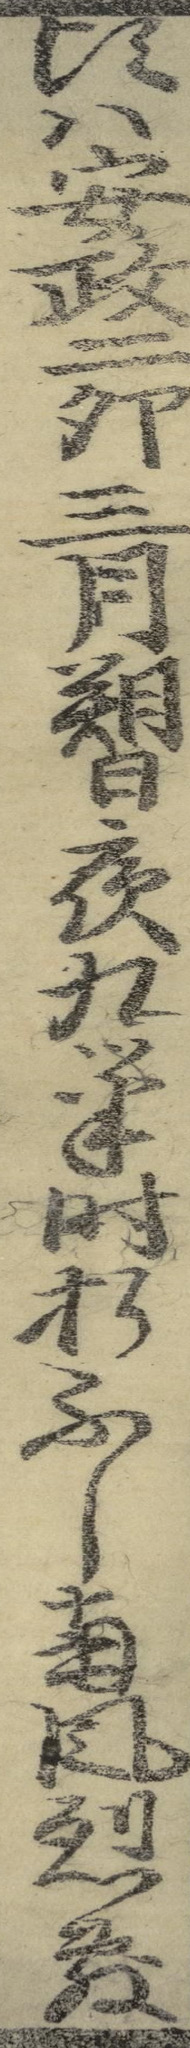頃は安政二卯三月朔日夜九ツ半時折ふし南風烈敷
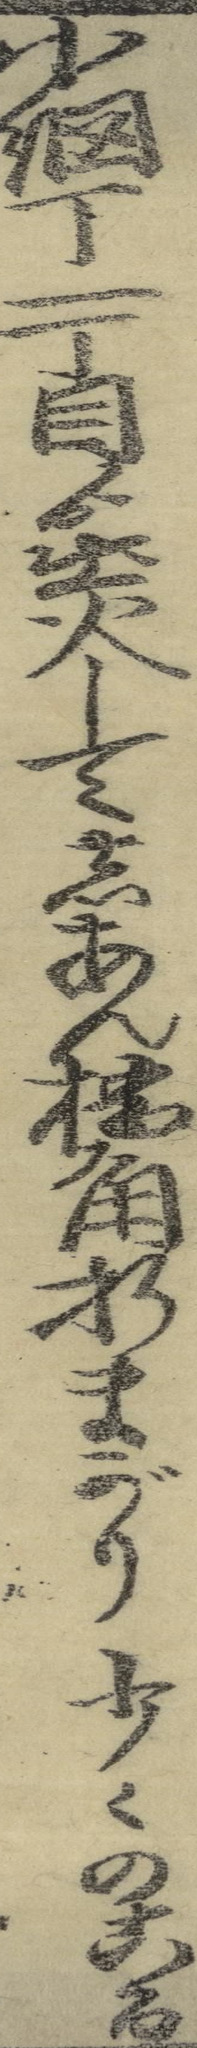小網丁二丁目ゟ出火してしあん橋角折まがり少々のこる
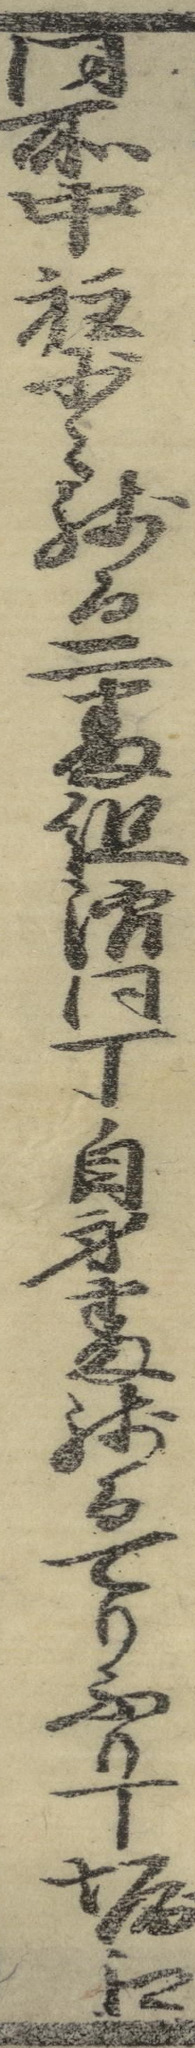同所中程少々残る二番組消同丁自身番残るてりふり丁堀江
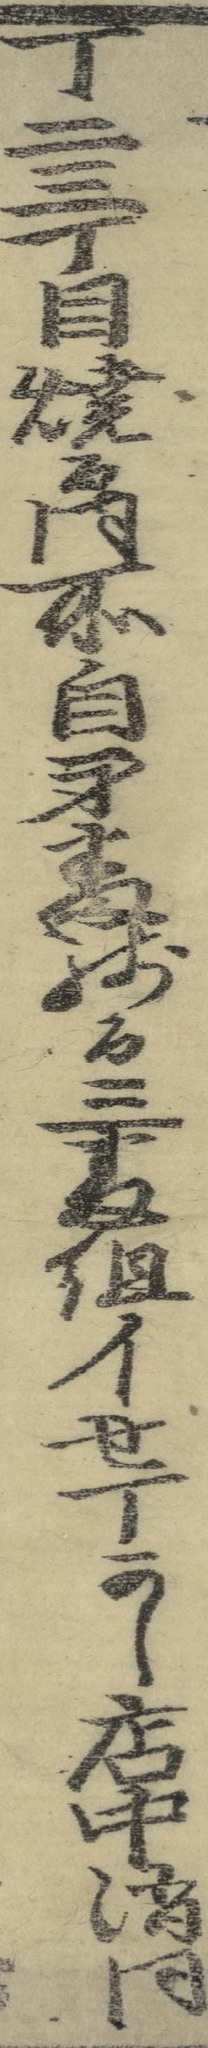丁二三丁目焼る同所自身番残る三番組イセ丁かし店中消同
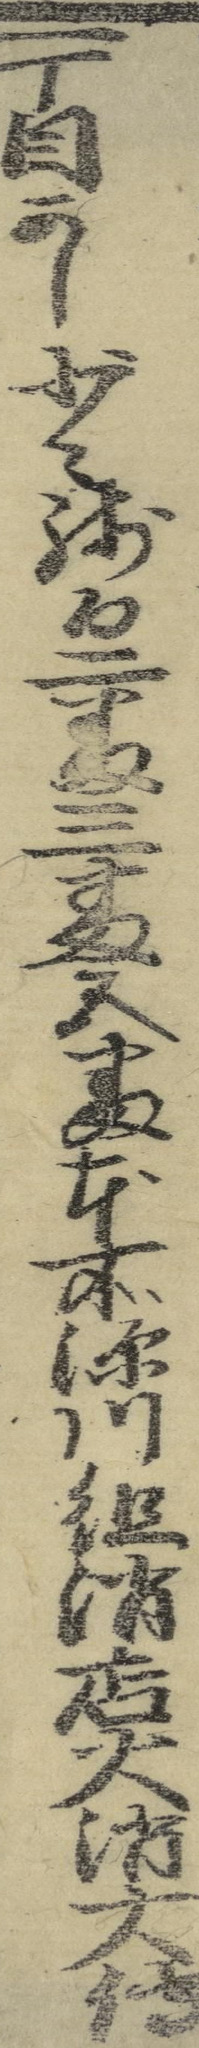一丁目かし少々残る二番三番五番本所深川組消店火消大伝
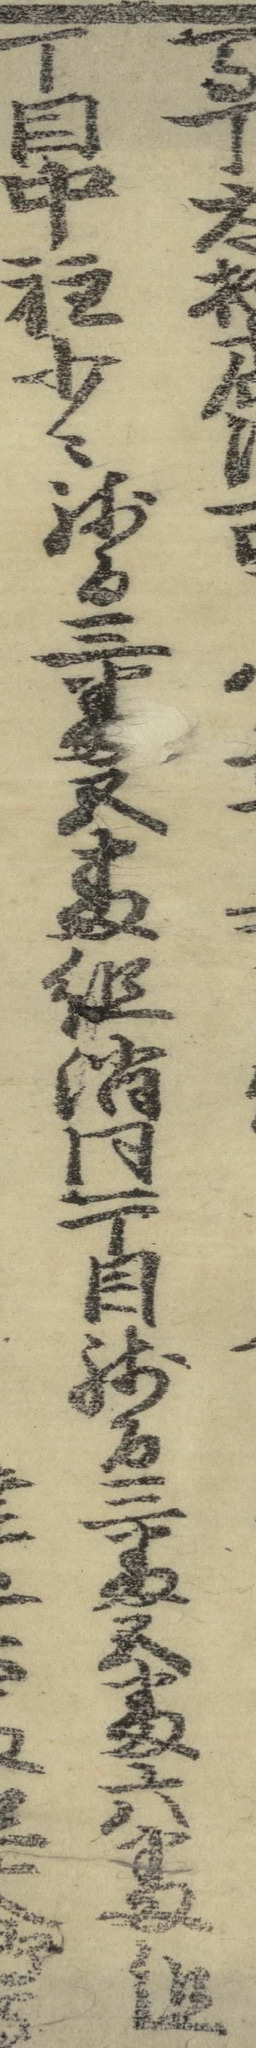丁目中程少々残る三番五番組消同一丁目残る三番五番六番組
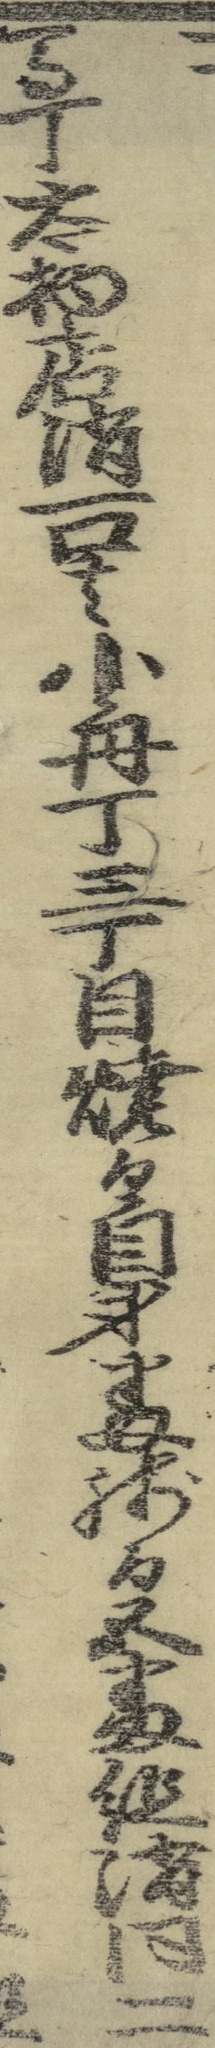馬丁太物店消一口は小舟丁三丁目焼る自身番残る五番組消同二
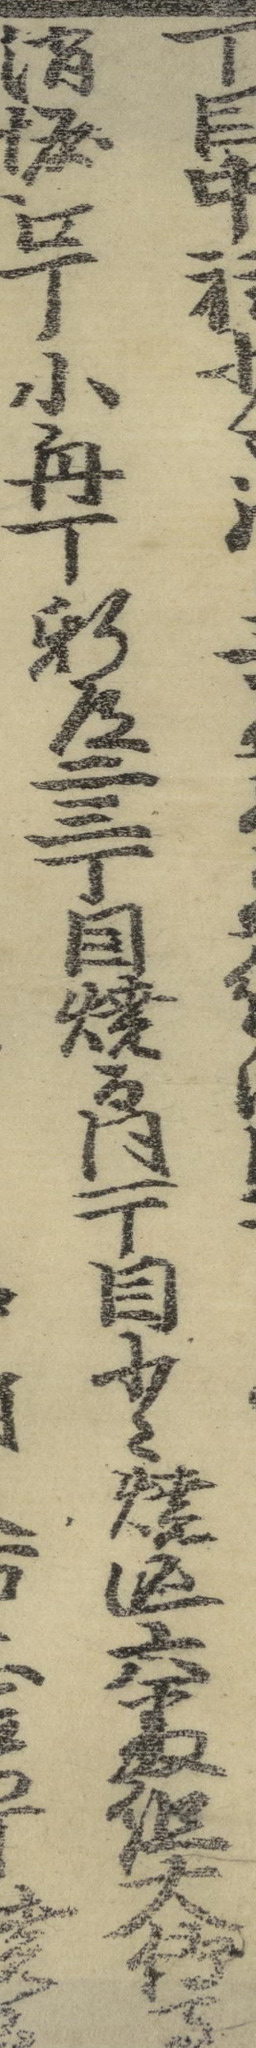消堀江丁小舟丁新道二三丁目焼る同一丁目少々焼込六番組大伝馬
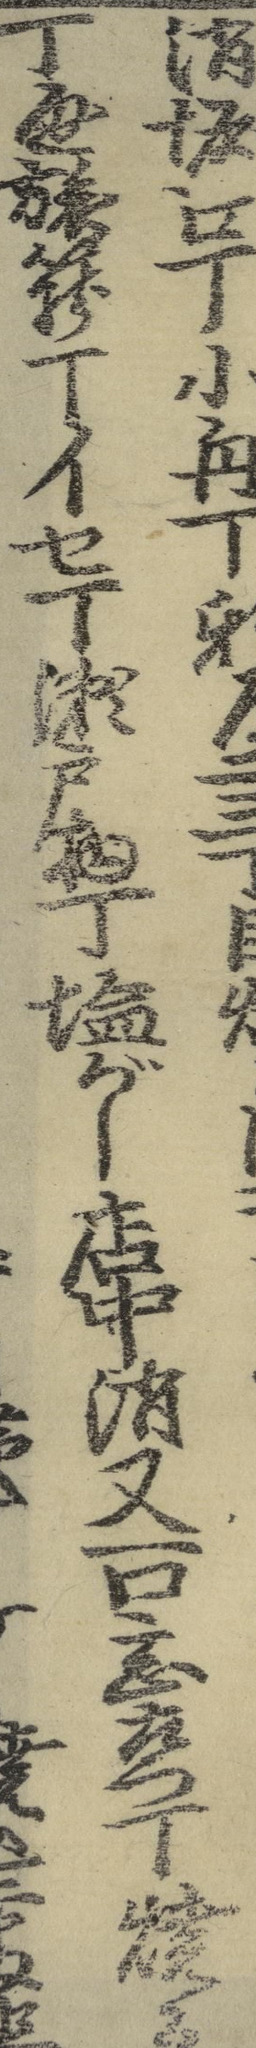丁通旅籠丁イセ丁瀬戸物丁塩がし店中消又一口甚左衛門丁焼る
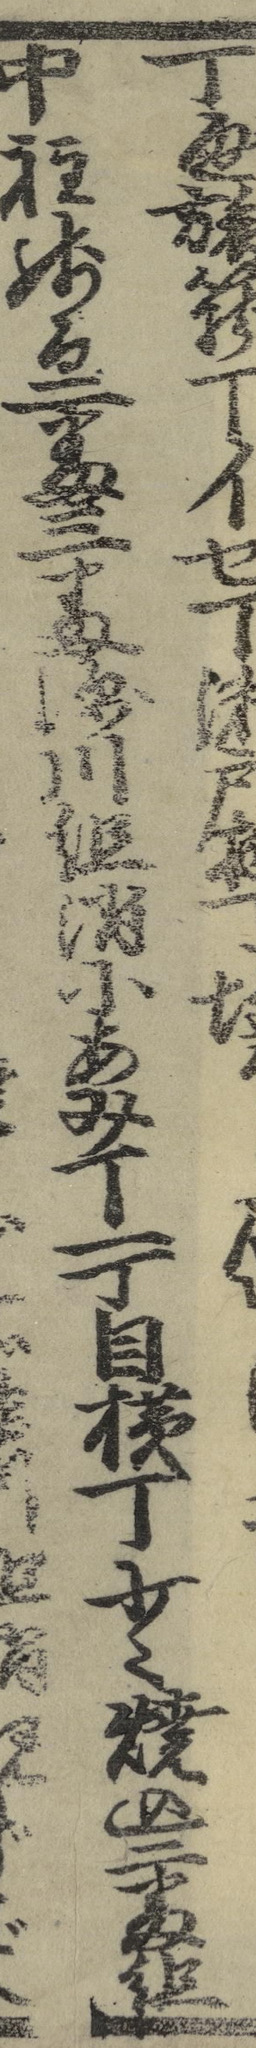中程残る二番三番深川組消小あみ丁一丁目横丁少々焼込二番組
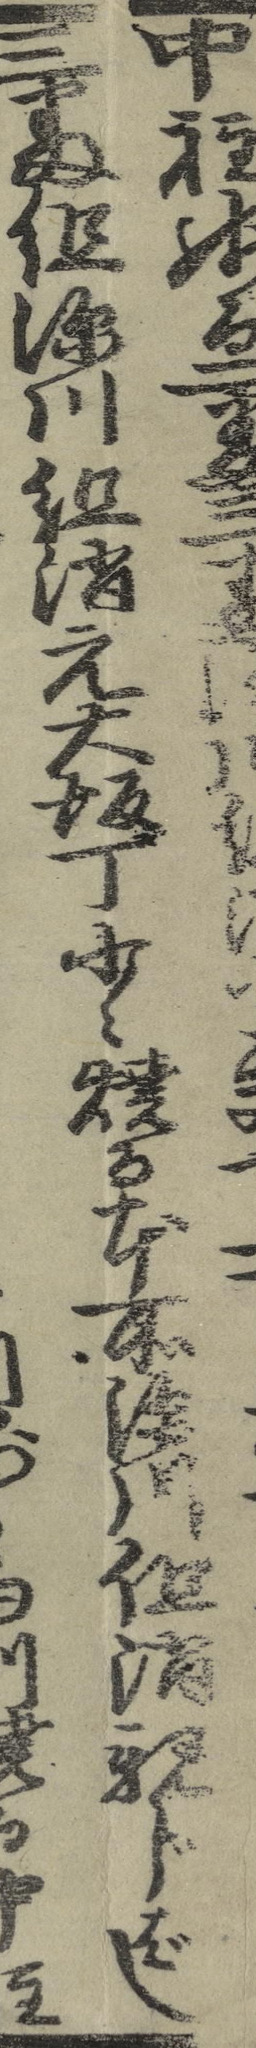三番組深川組消元大坂丁少々焼る本所深川組消親じばし
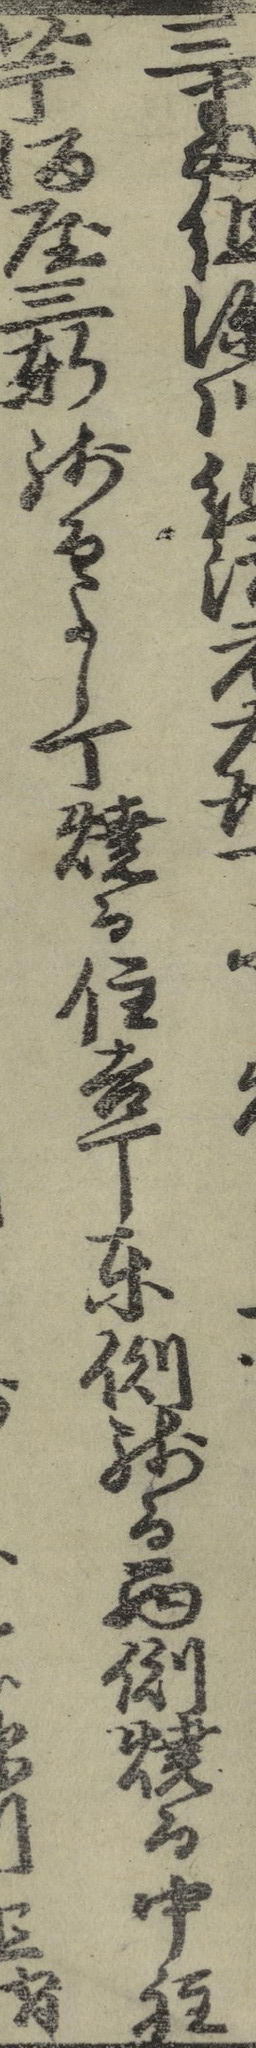芋酒屋三軒残るよし丁焼る住吉丁東側残る西側焼る中程
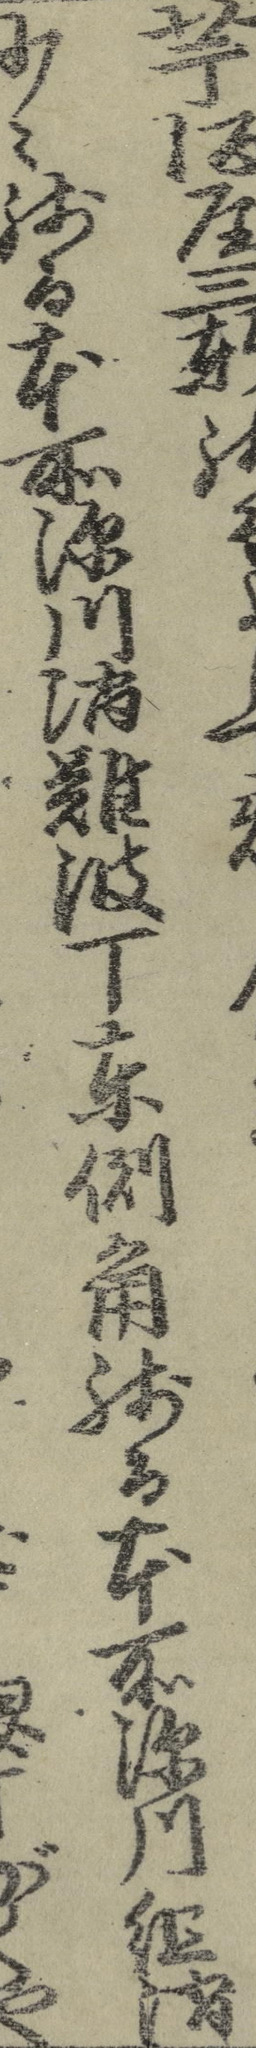少々残る本所深川消難波丁東側角残る本所深川組消
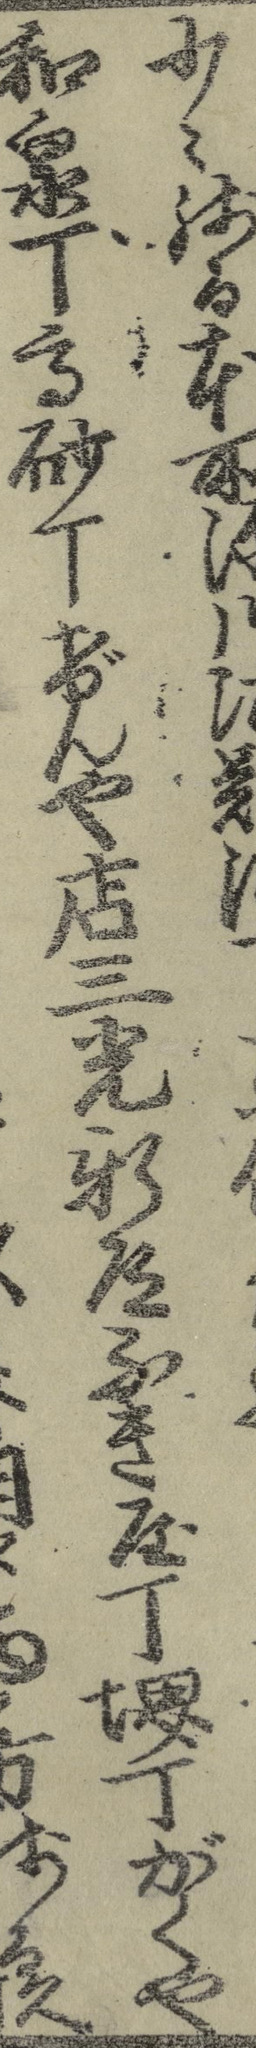和泉丁高砂丁げんや店三光新道ふき屋丁堺丁がくや
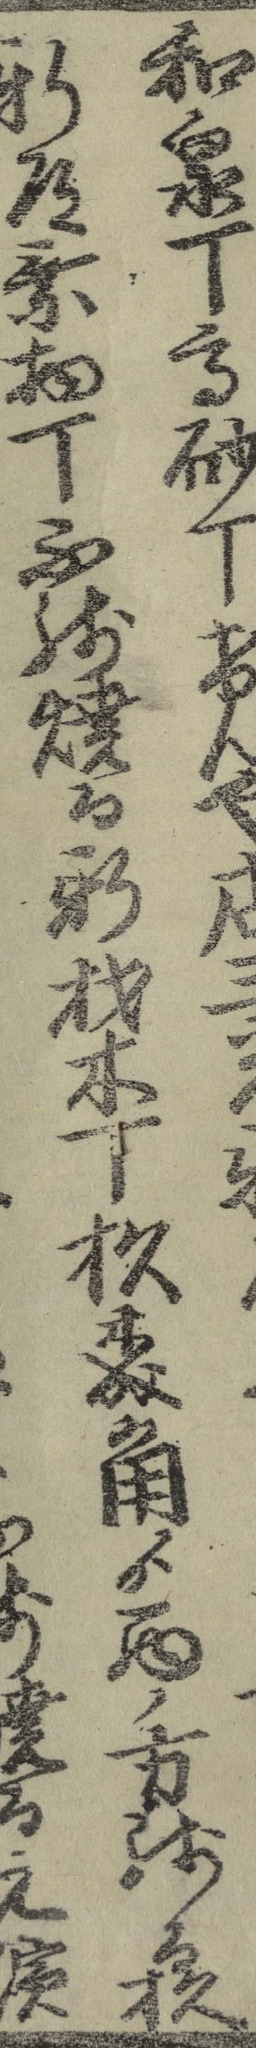新道乗物丁不残焼る新材木丁杉森角ゟ西ノ方残る杉
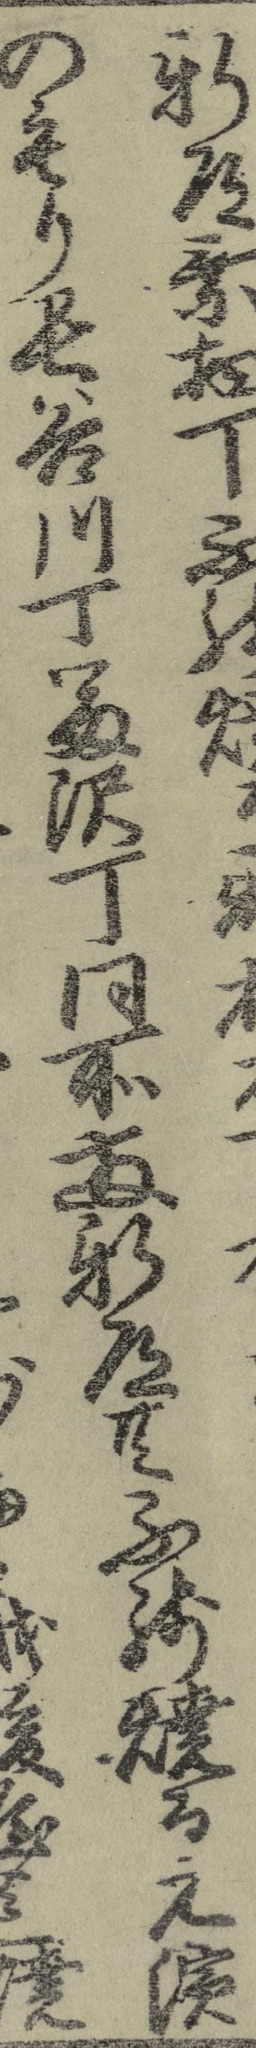のもり長谷川丁冨沢丁同所両新道共不残焼る元浜
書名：[安政二年三月の江戸大火に関する瓦版]
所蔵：東京大学地震研究所図書室 Earthquake Research Institute Library, The University of Tokyo, JAPAN
